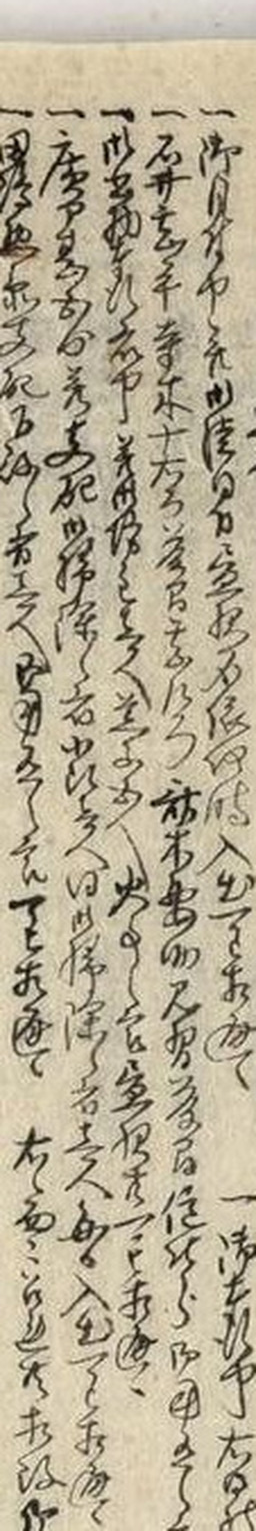一御書物奉行衆中并御坊主壱人荒子五人火事之節昼夜共可被相通候
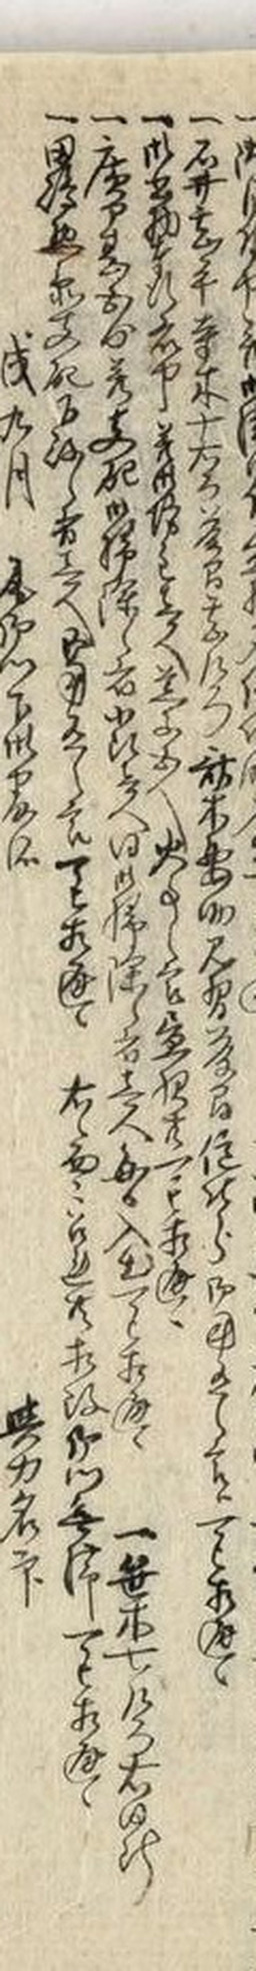一広部甚五右衛門并支配御掃除之者小頭壱人同御掃除之者壱人毎日入出可被相通候一笹木七左衛門右同断
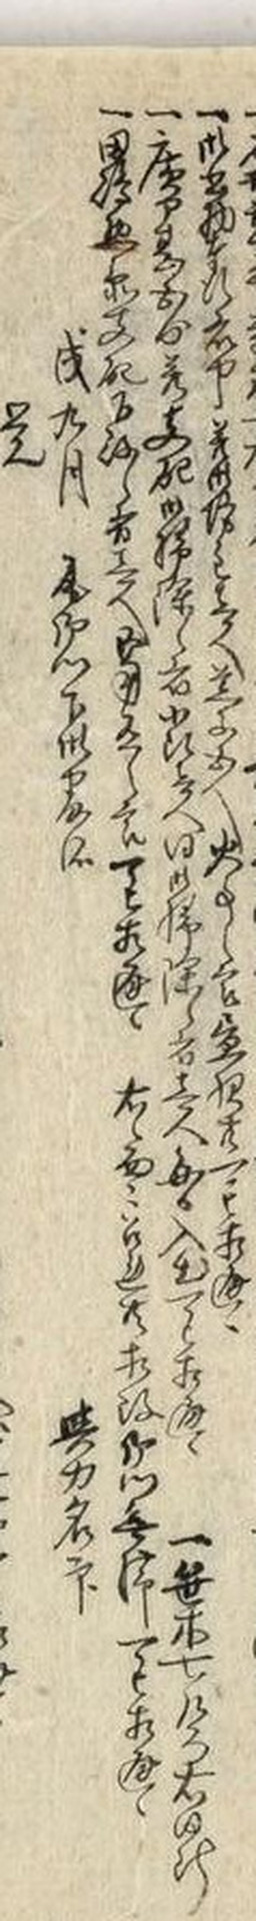一田嶋惣兵衛支配下役之者壱人御用有之候節可被相通候右之面々召連共相改御門無滞可被相通候
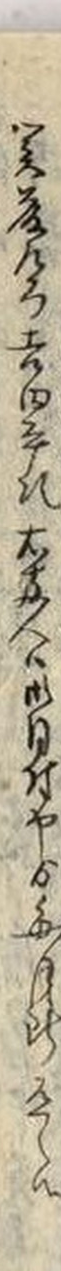関藤左衛門吉田平次右両人は御目付中ゟ毎月断有之候

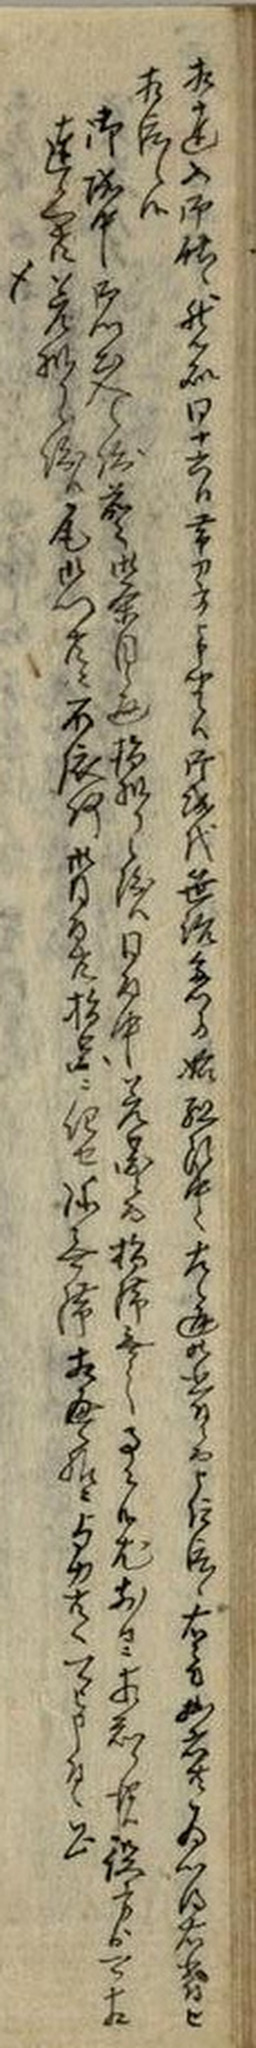御城中御門出入之儀前々御条目之通指掛り候儀は目付中差図に而指滞無之事に候尤前々に相知候儀は役方ゟ可相
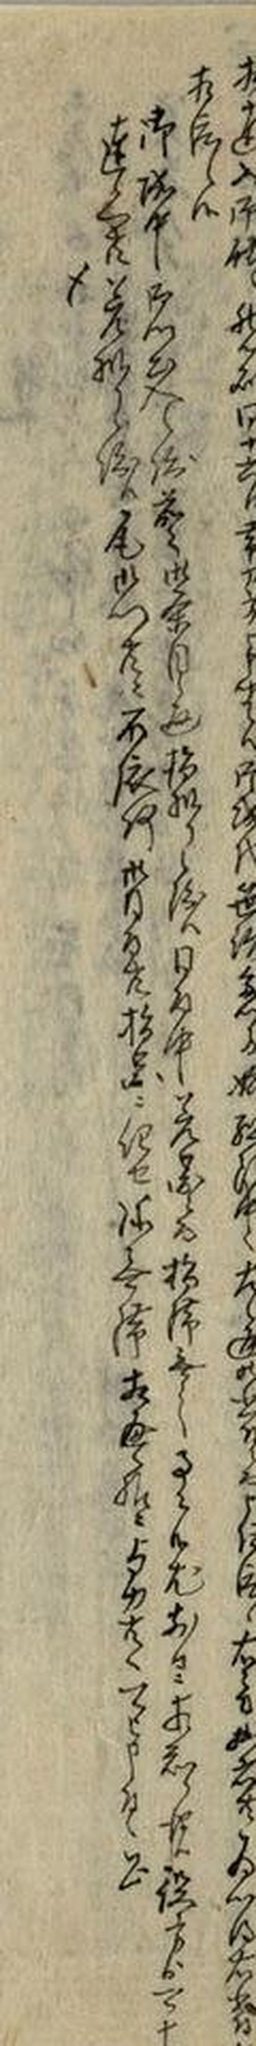達候へ共差掛り候儀は瓦御門共々不依何御目付共指図に任弥無滞相通候様に与力共へ可被申付候以上
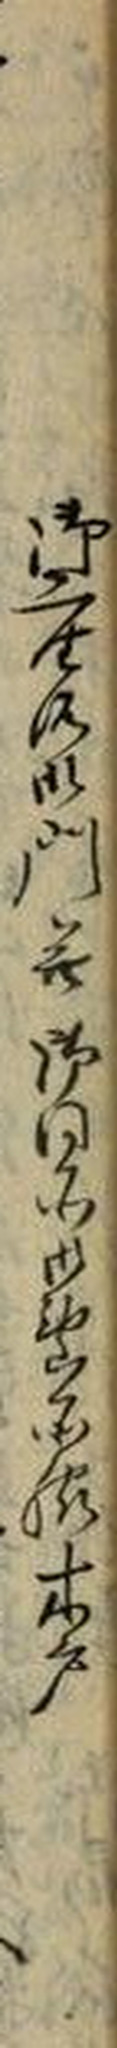御座所御門并御同所御台所脇木戸
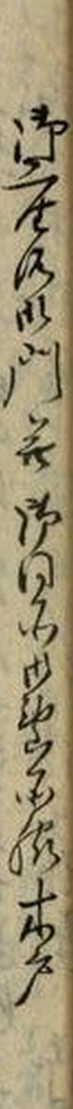御座所御門并御同所御台所脇木戸
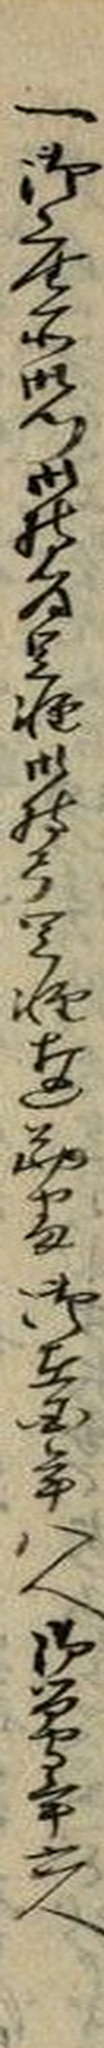一御座所御門御持筒足軽御持弓足軽打込勤番御在国年八人御留守年六人
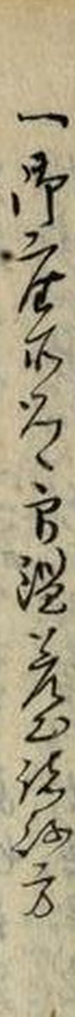一御座所御門へ印鑑差出諸役方
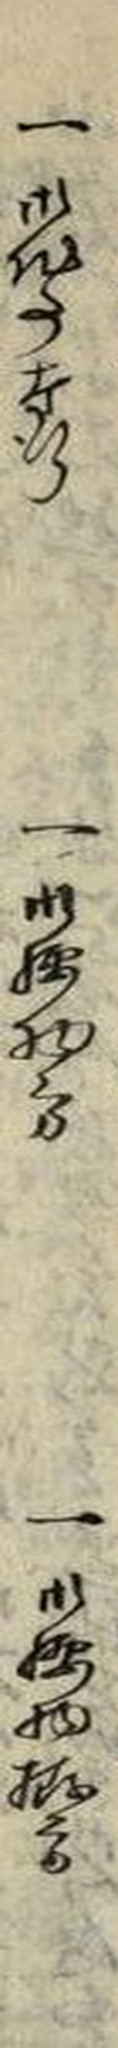一御作事奉行一御腰物方一御腰物拵方
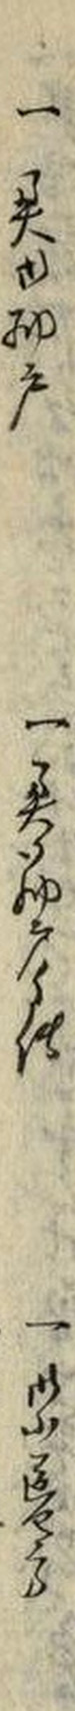一奥御納戸一奥御納戸手伝一御小道具方
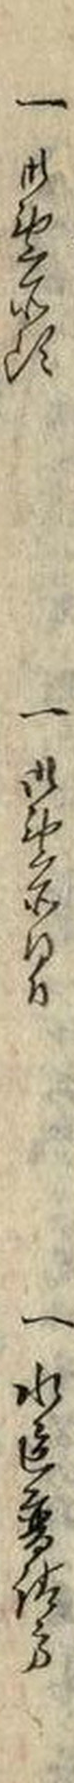一御台所頭一御台所目付一水道普請方
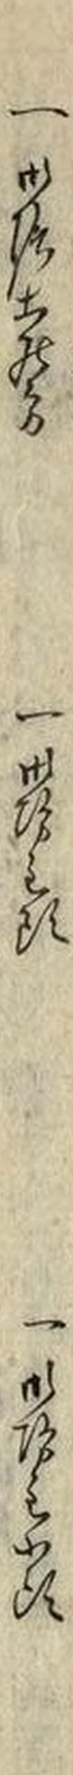一御堀土居方一御坊主頭一御坊主小頭
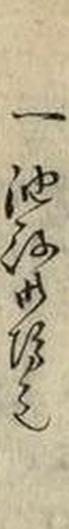一油役御坊主
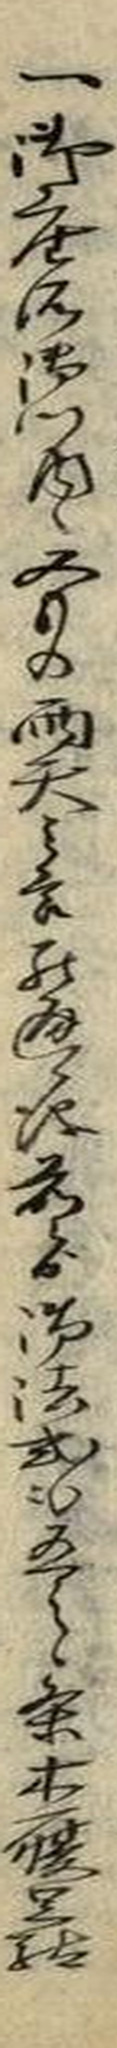一御座所御門内之又もの雨天之節罷通候儀前々ゟ御法式も有之候条木履足駄
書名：御門御櫓之部
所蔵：福井県文書館 Fukui Prefectural Archives
